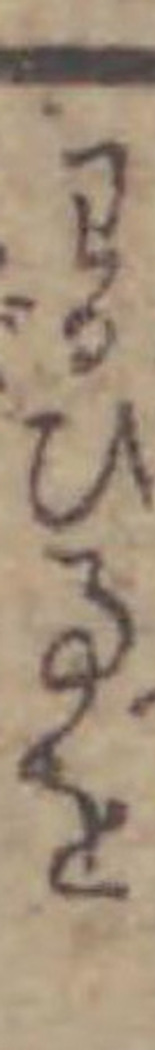わるひ事を
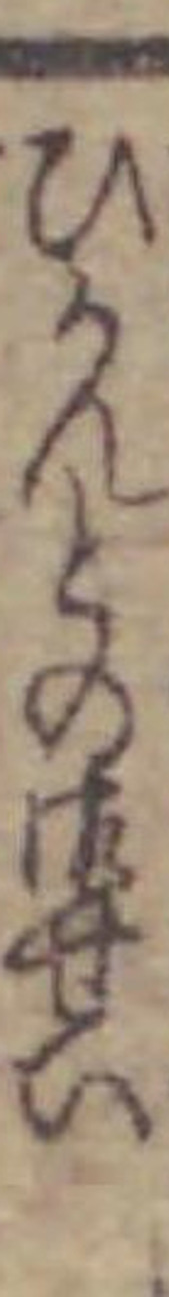ひかんとの御せい
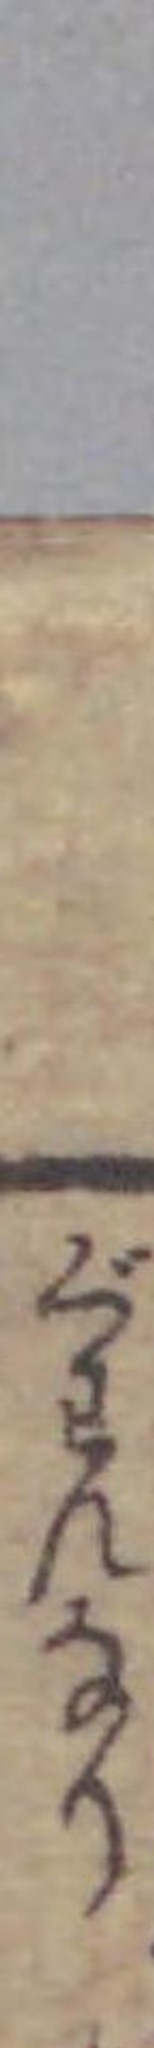ぐわんなり
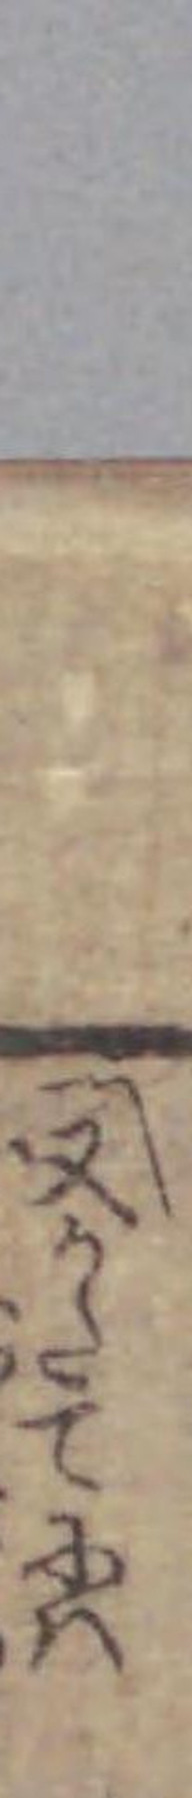「又かたてには
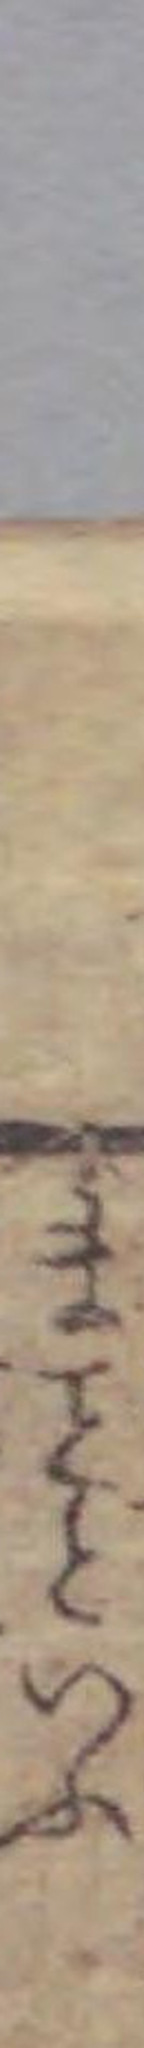まことといふ
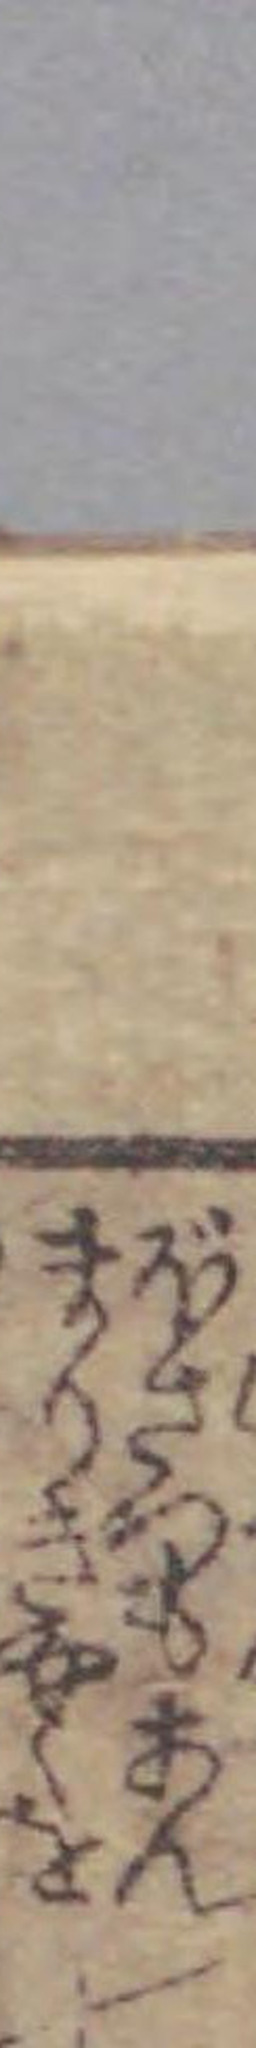まりきやくを
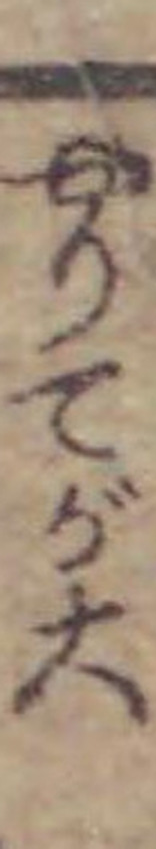やりてが大
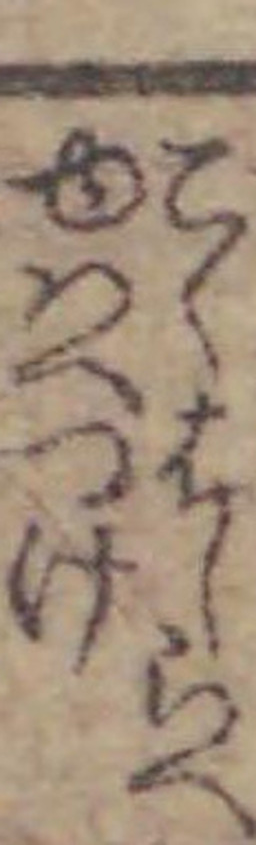ゆはへつけ
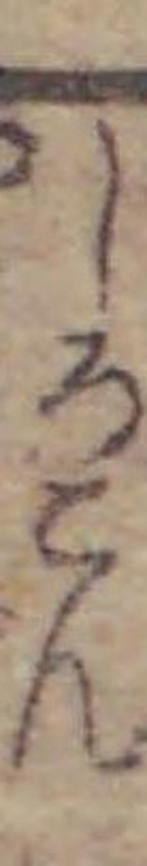しろこん
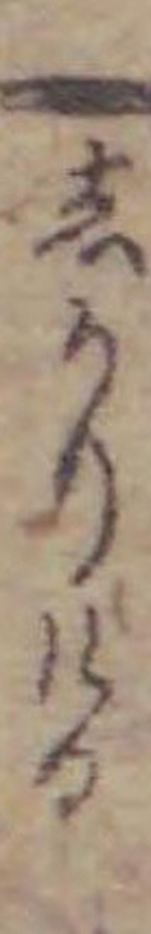しかりける

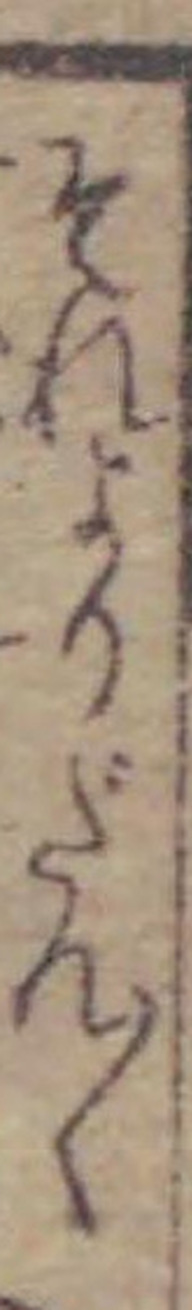それよりだん〳〵
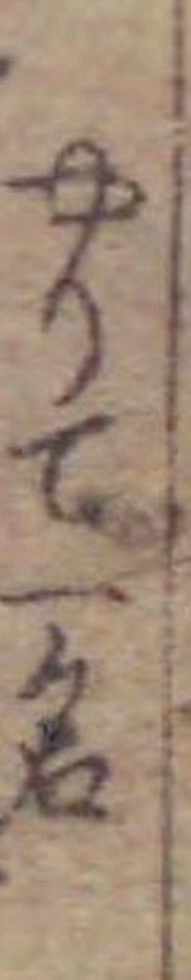やりて一名
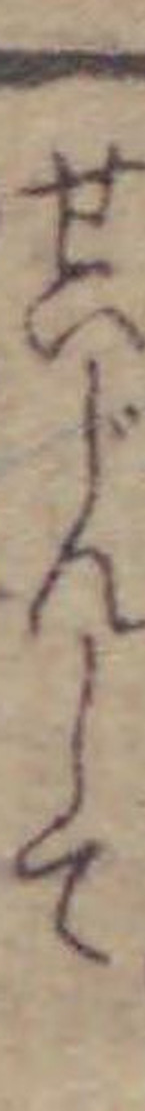せいじんして
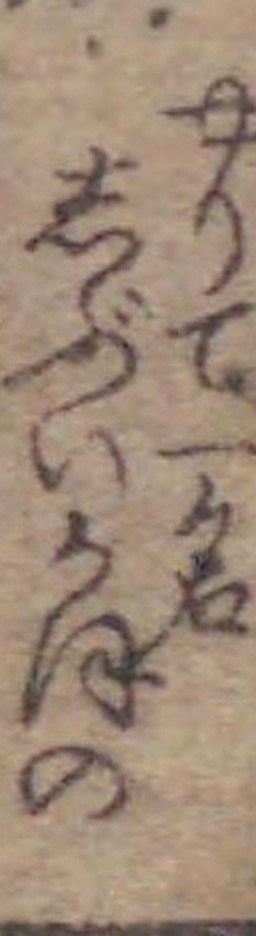しぶいかほの
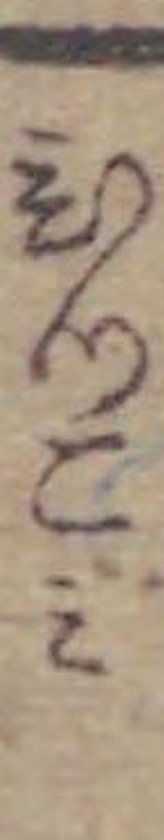ひつこみ
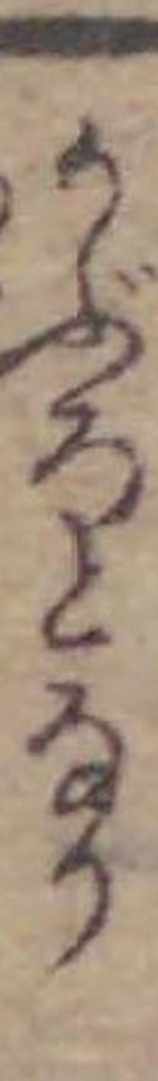かぶろとなり
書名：九替十年色地獄 : 3巻
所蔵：国立国会図書館 National Diet Library, JAPAN
